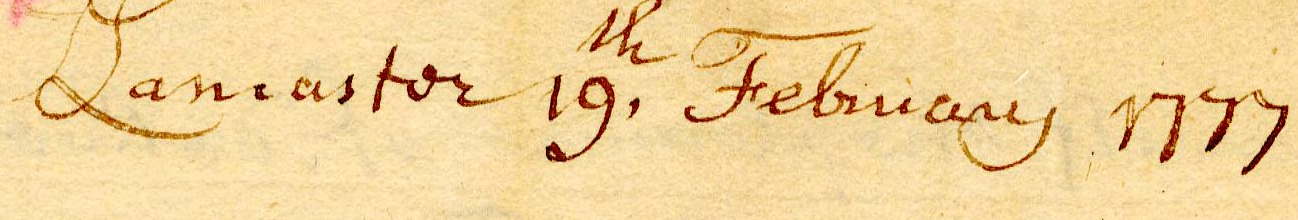Lancaster 19^th. February 1777
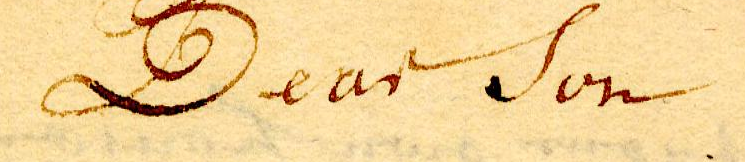Dear Son
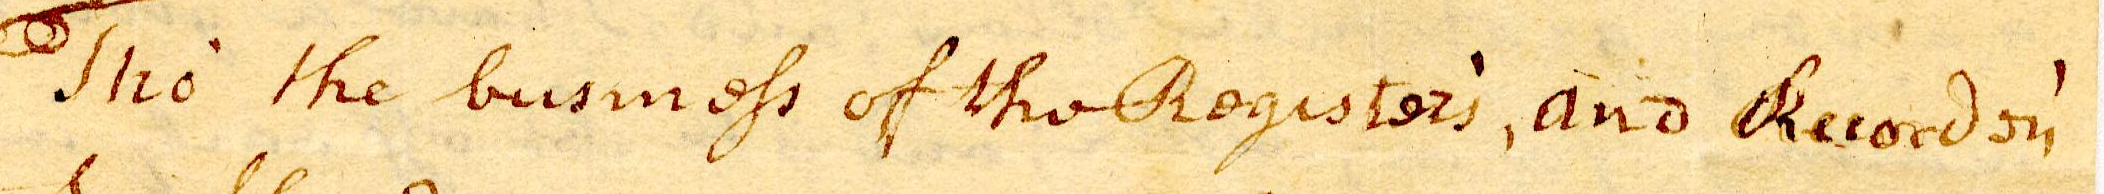Tho' the business of the Register's, and Recorder'
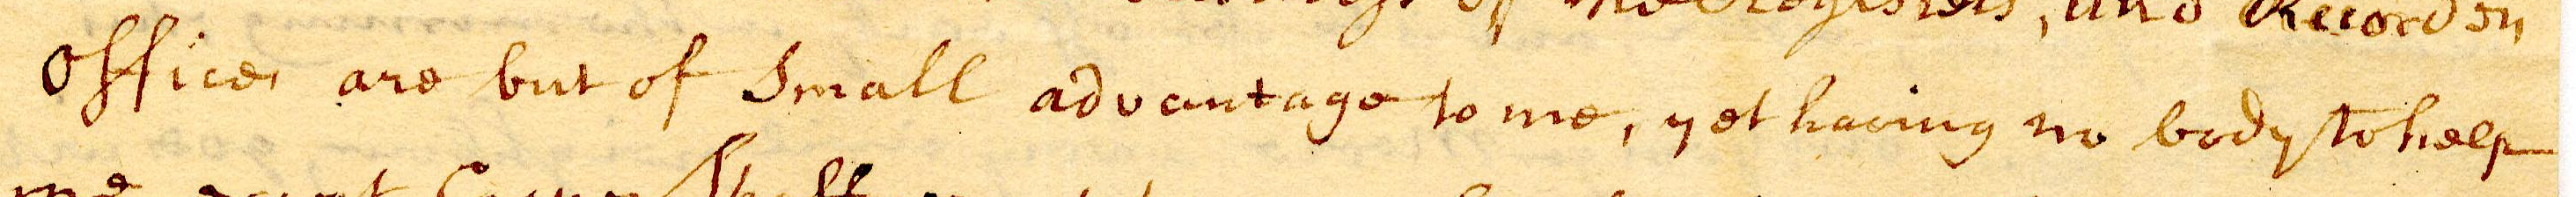offices are but of Small advantage to me, yet having no body to help
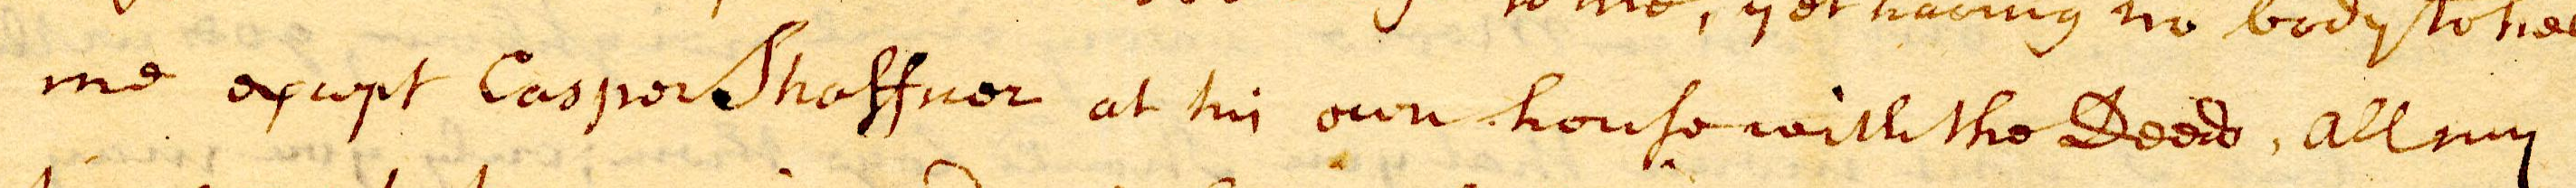me except Casper Shaffner at his own house with the Deeds, all my
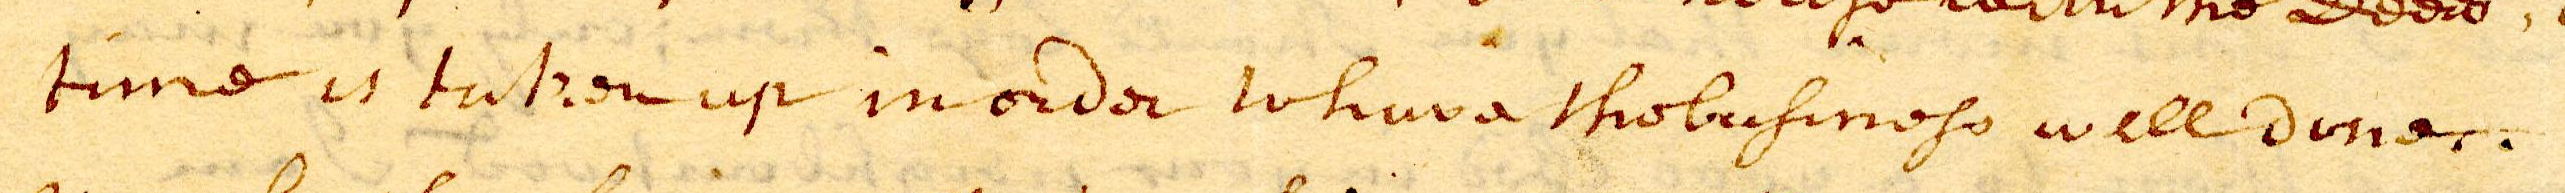time is taken up in order to have the business well done.
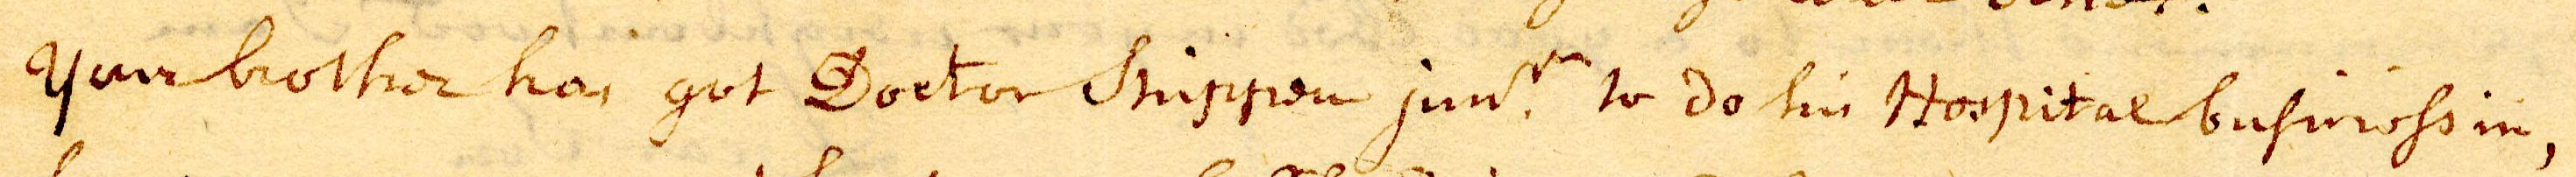Your brother has got Doctor Shippen jun^r. to do his Hospital business in,
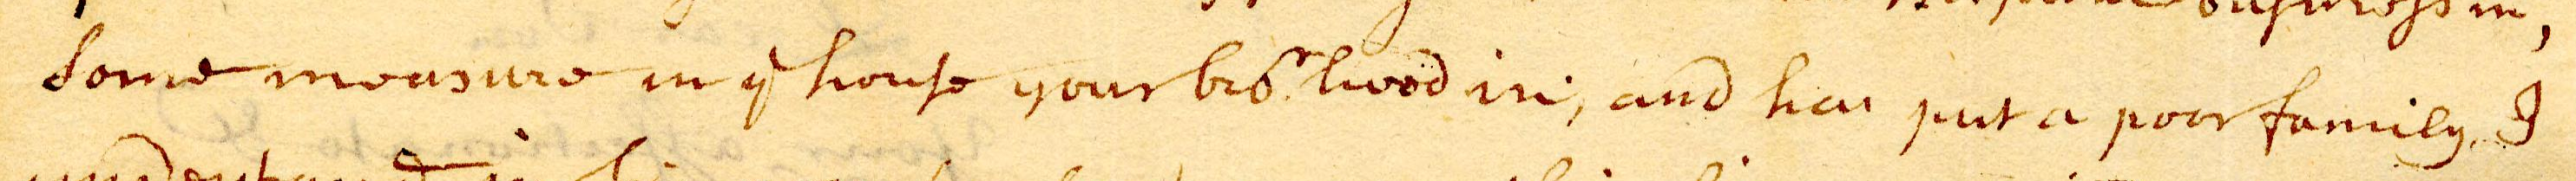some measure in y^e house your bro^r. lived in, and has put a poor family, I
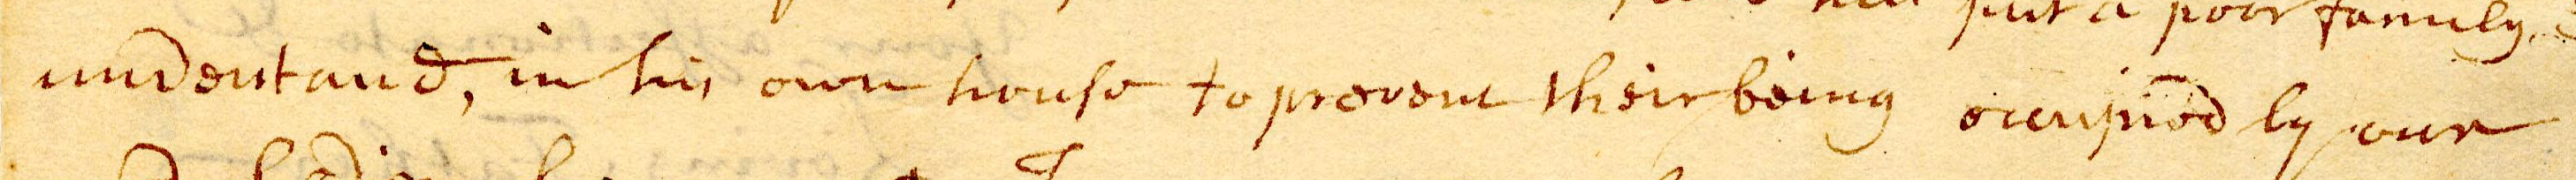understand, in his own house to prevent their being occupied by our
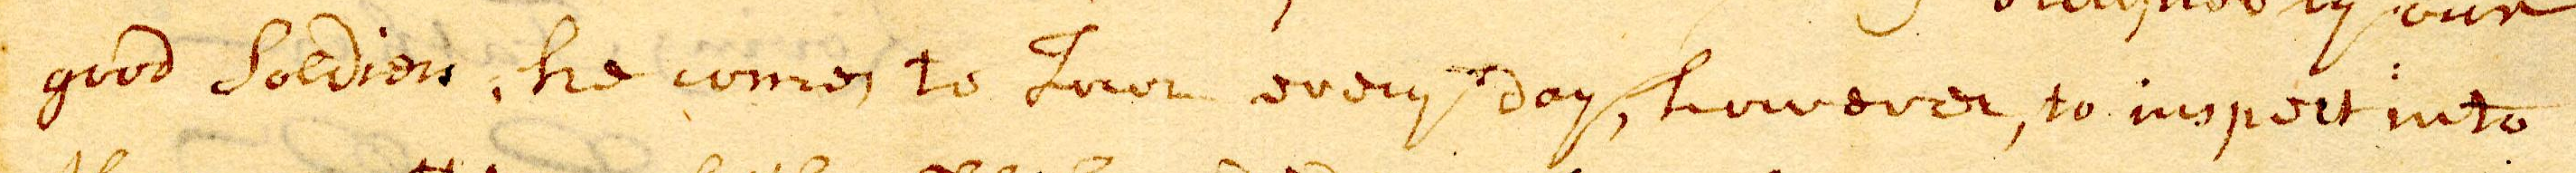good Soldiers, he comes to Town every day, however, to inspect into
